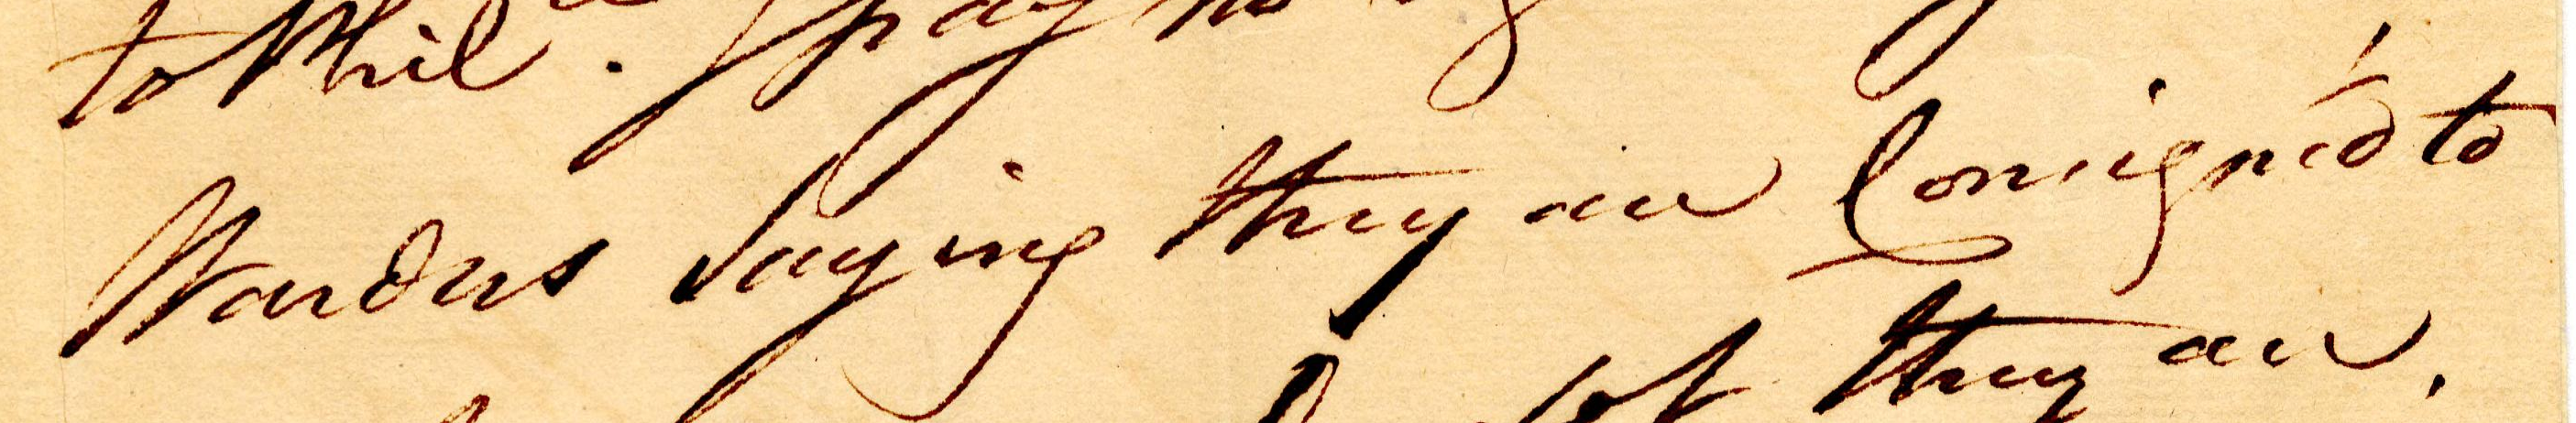Wardes saying they are Consigned to
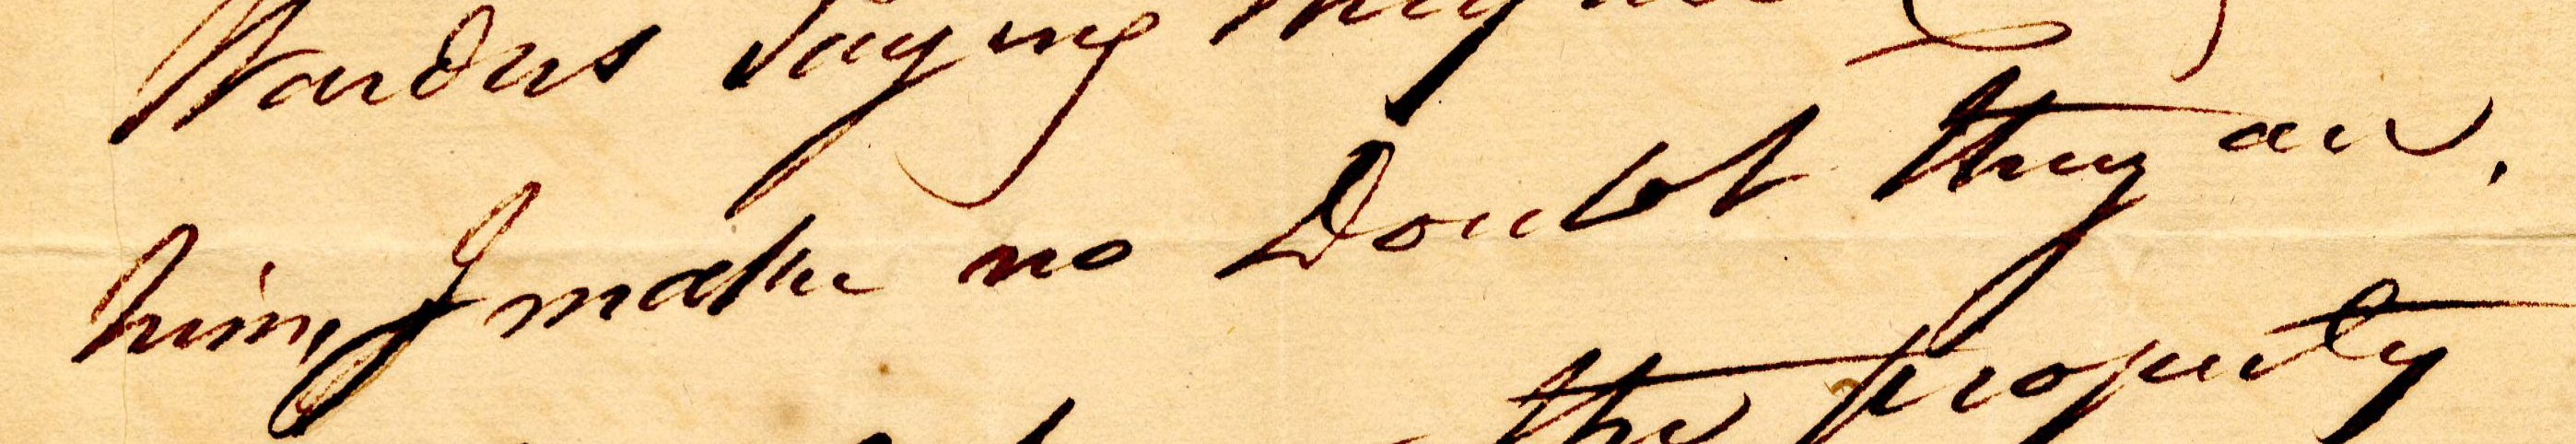him I make no Doubt they are.
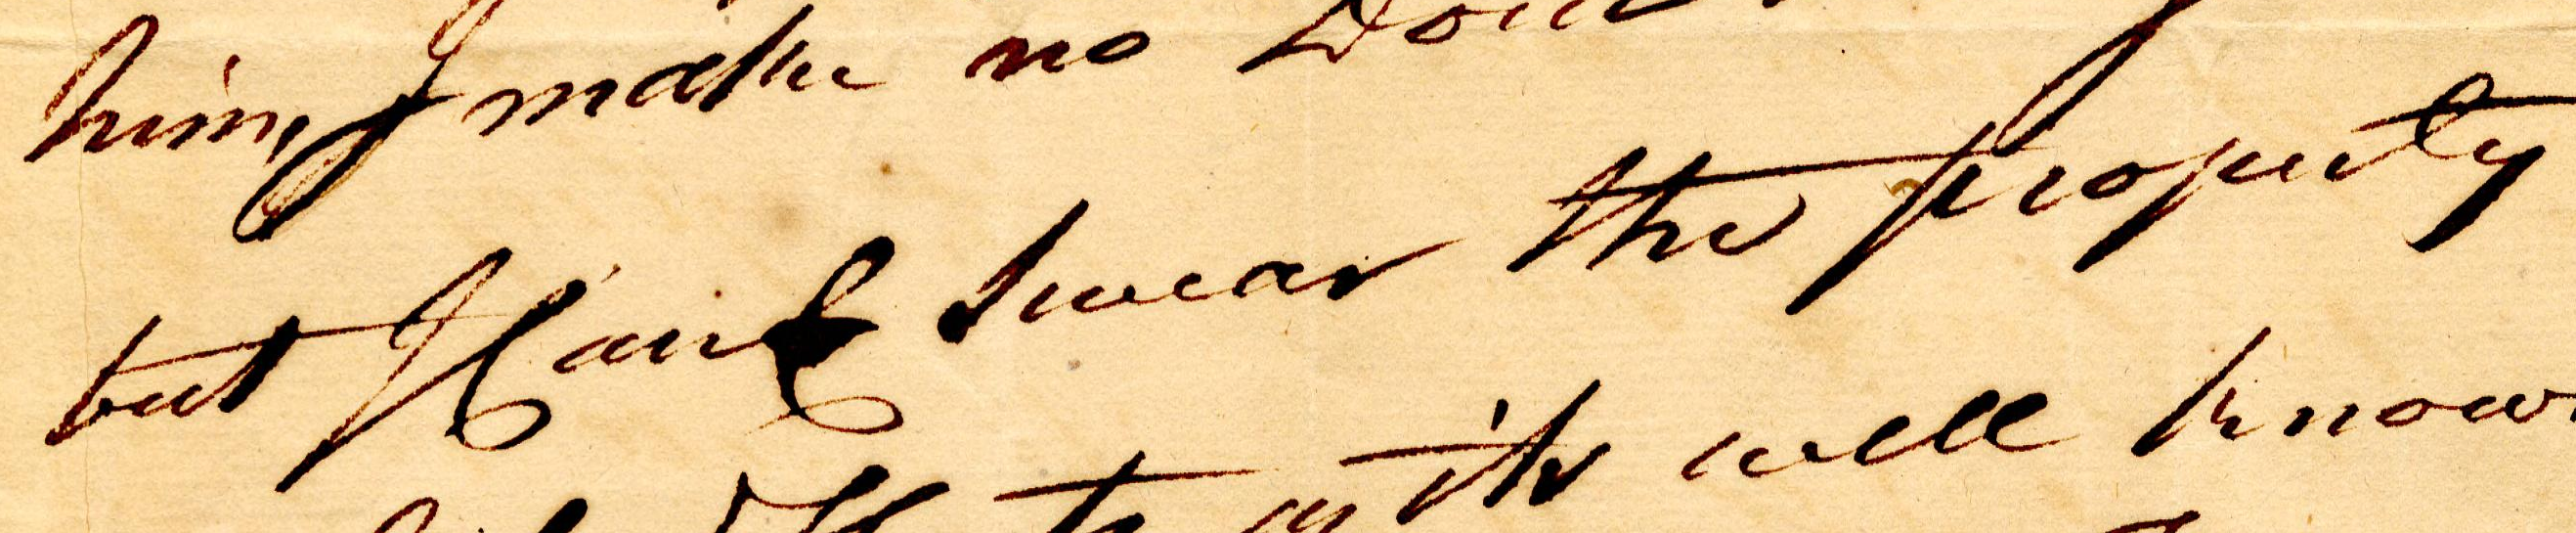but I can swear the property
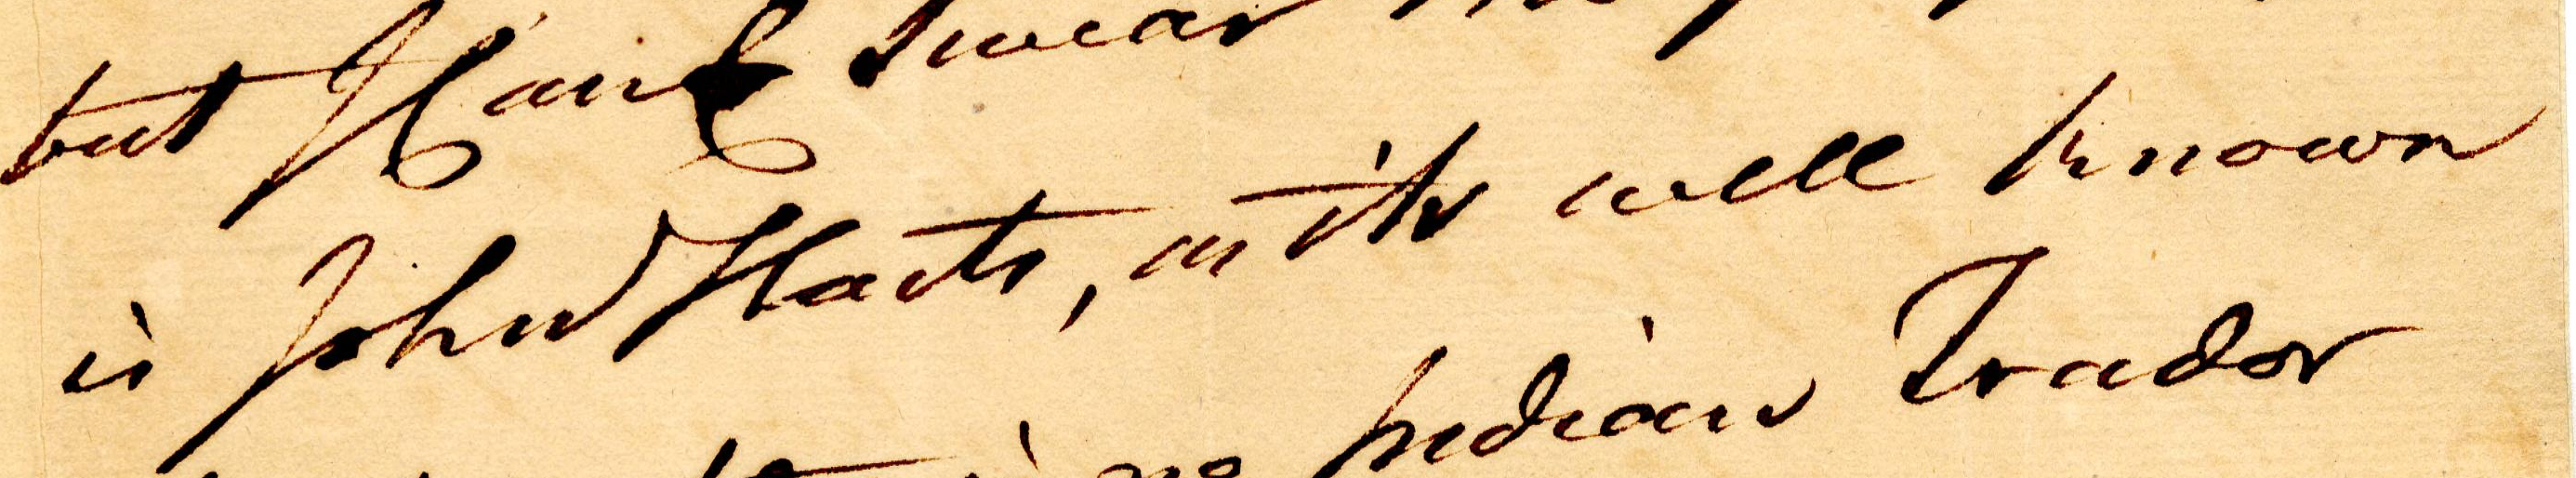is John Harts, as its well known
